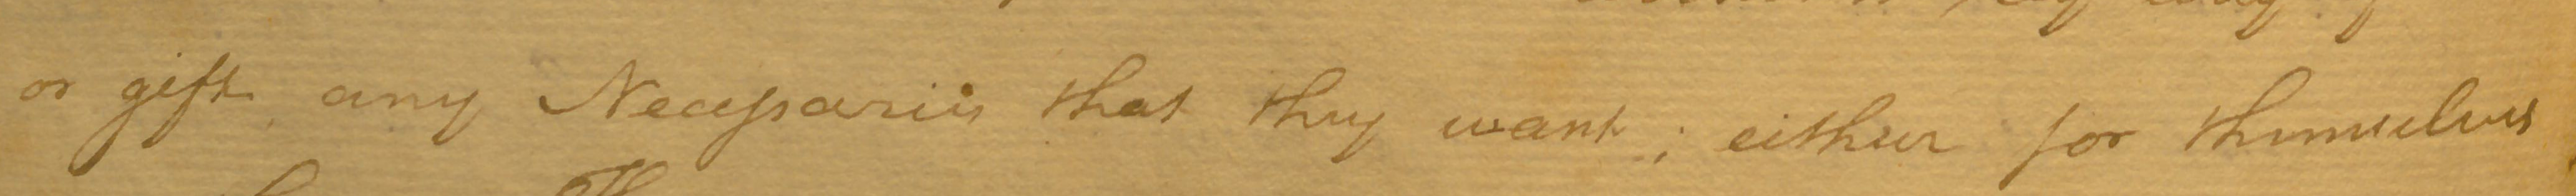or gift any Necessaries that they want; either for themselves
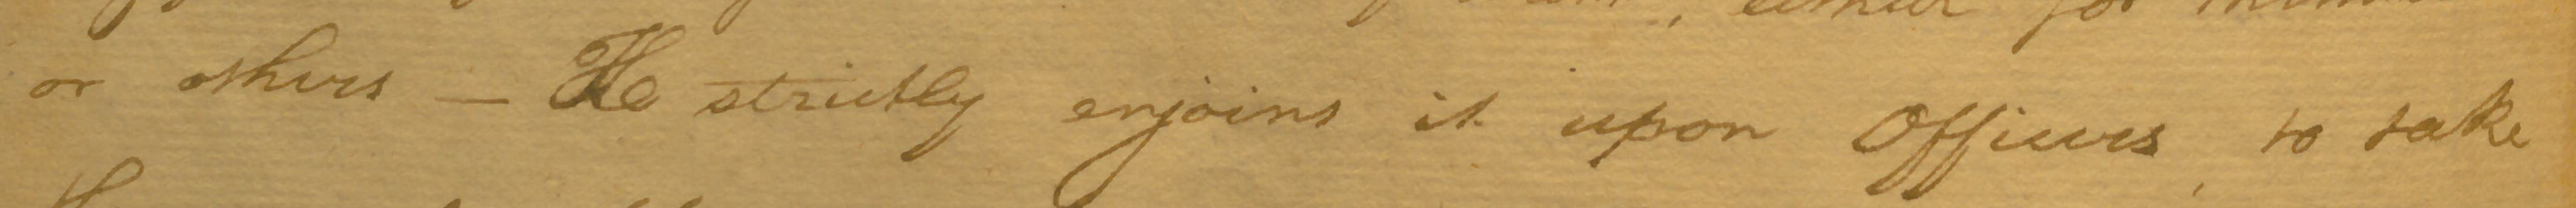or others- He strictly enjoins it upon Officers to take
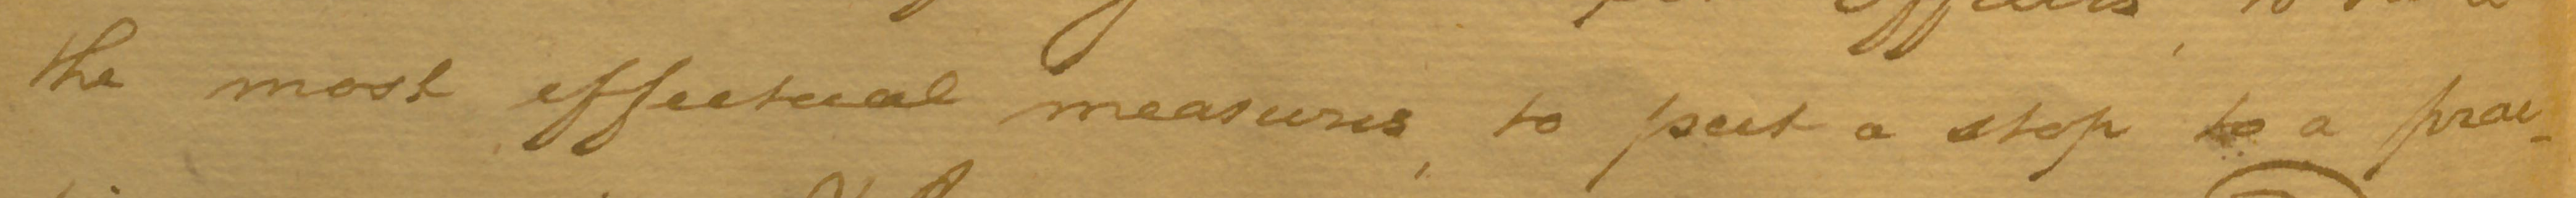the most effectual measures, to put a stop to a prac-
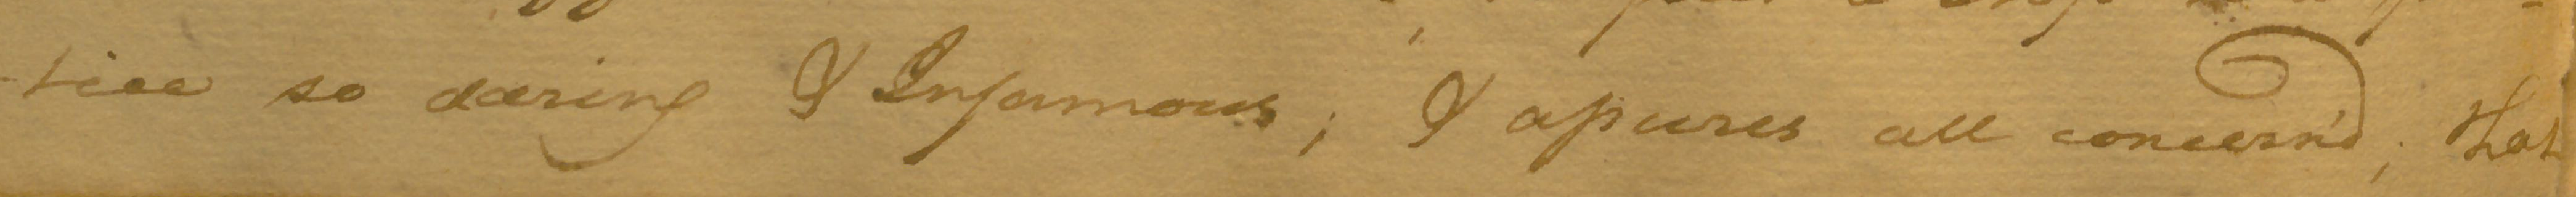tice so daring & Infamous; & assures all concern'd; that
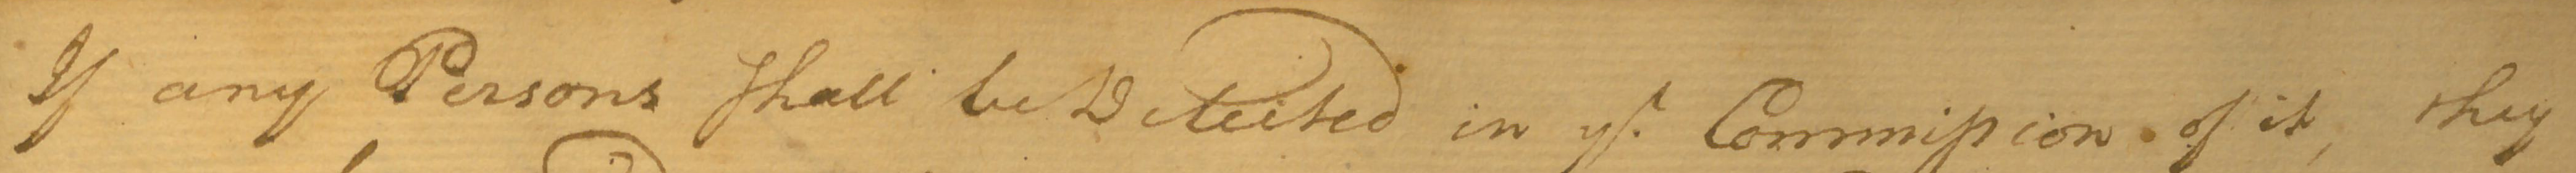If any Persons shall be Detected in y^e. Commission of it, they
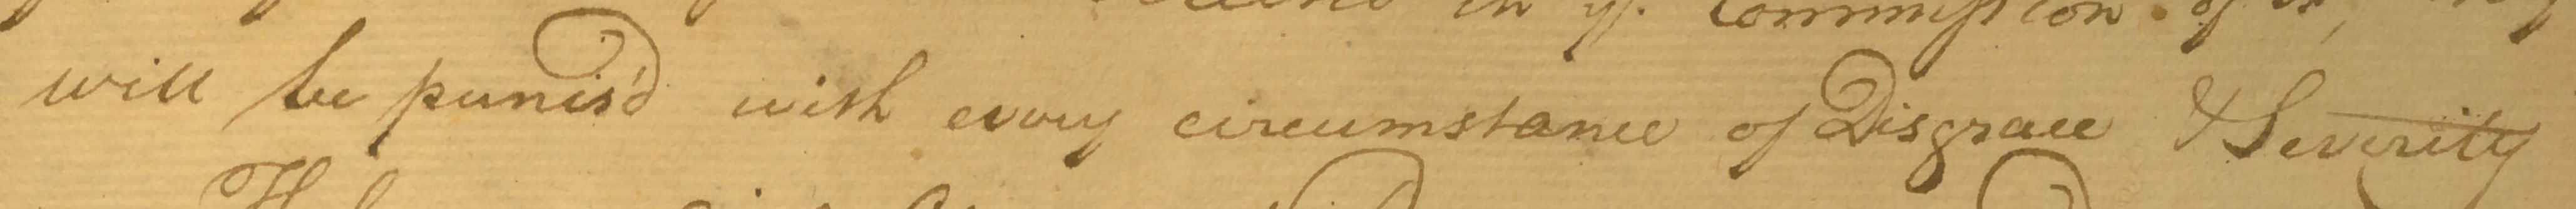will be punis'd with every circumstance of Disgrace & Severity
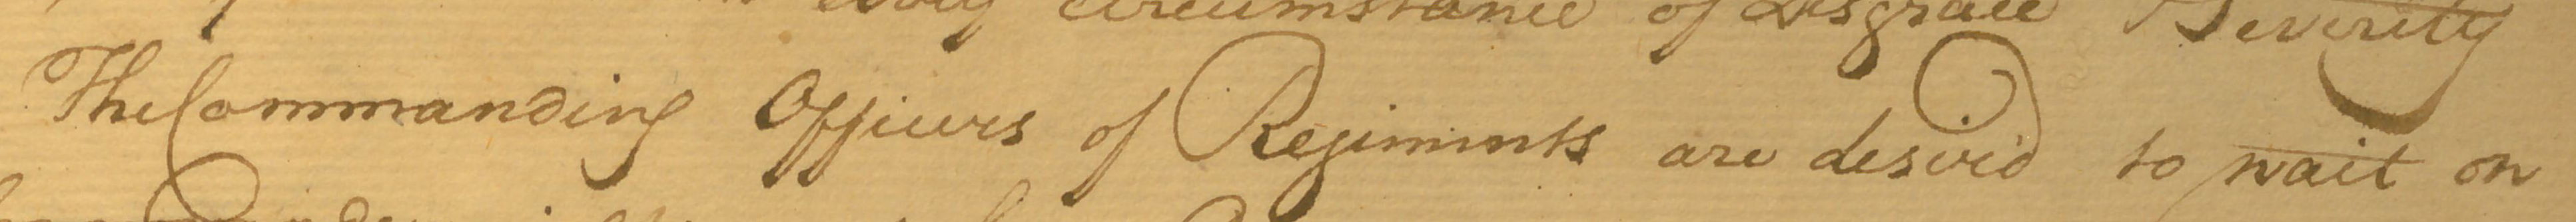The Commanding Officers of Regiments are desir'd to wait on
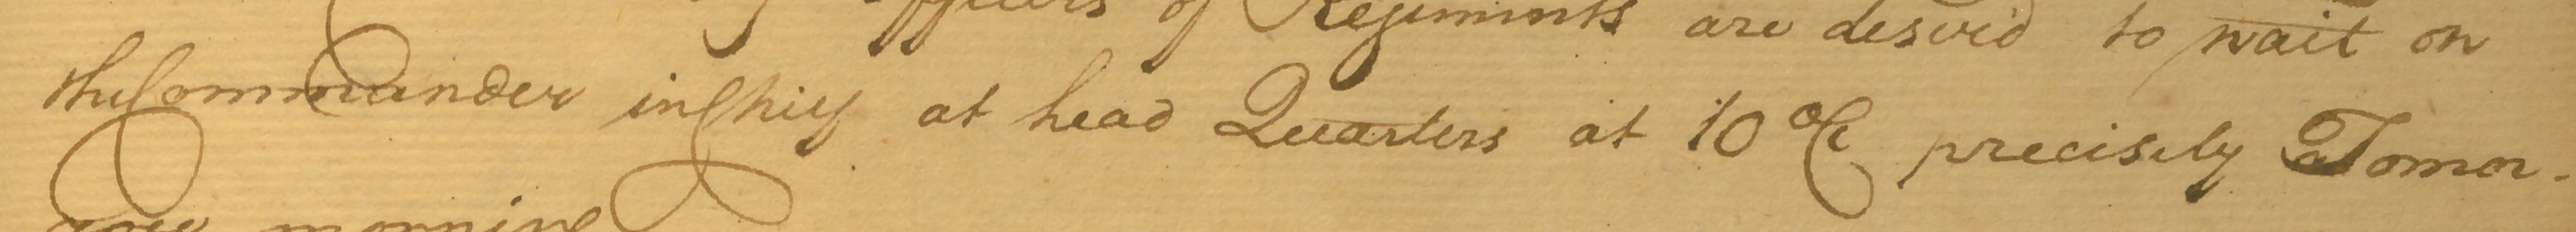the Commander in Chief at head Quarters at 10 ^oCl precisely Tomor-
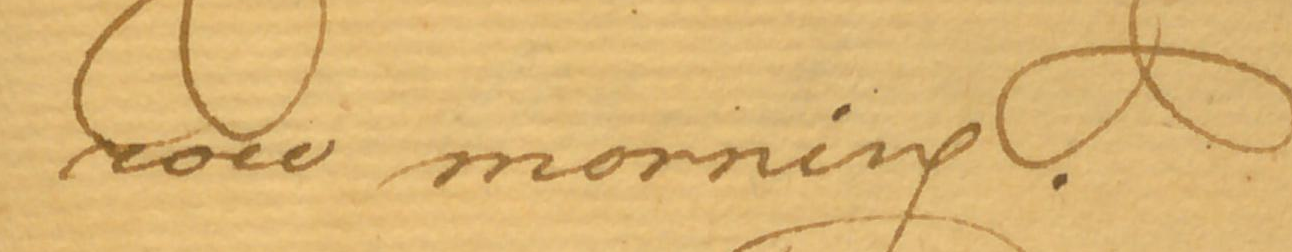row morning.
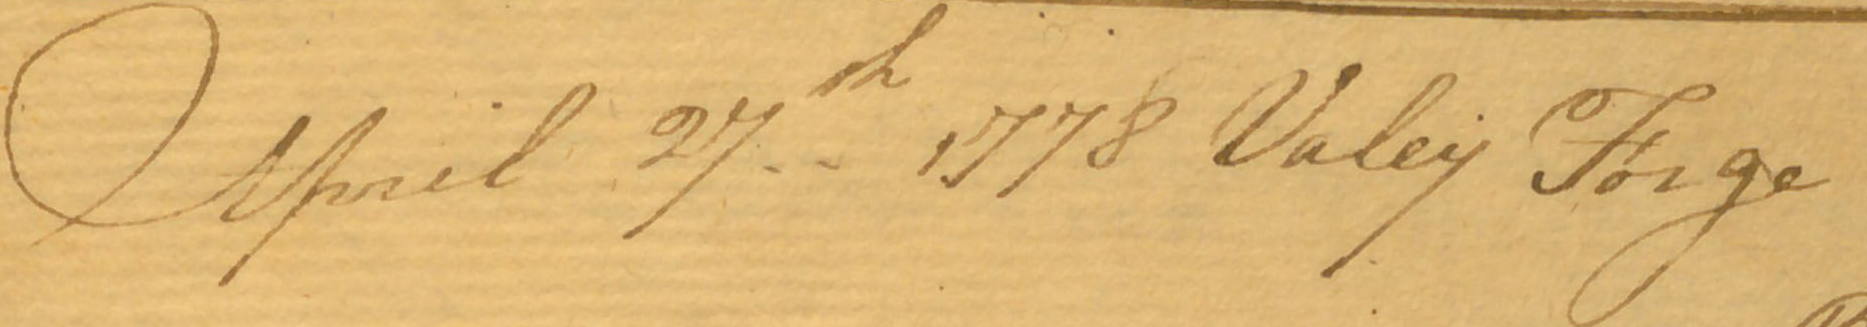April 27^th. 1778 Valey Forge
